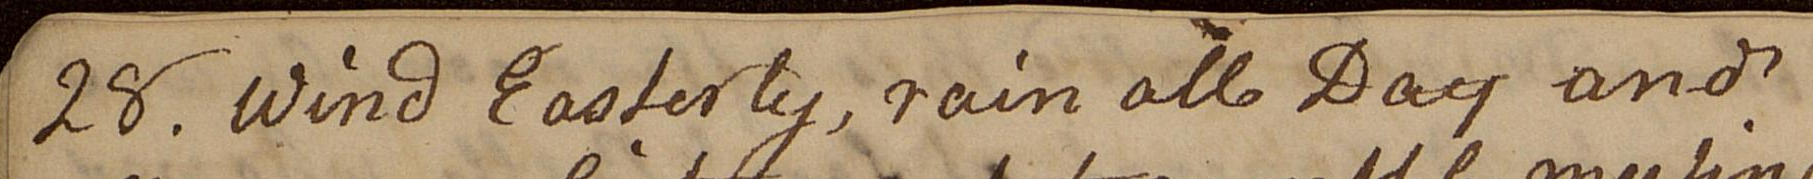28. Wind Easterly, rain all Day and
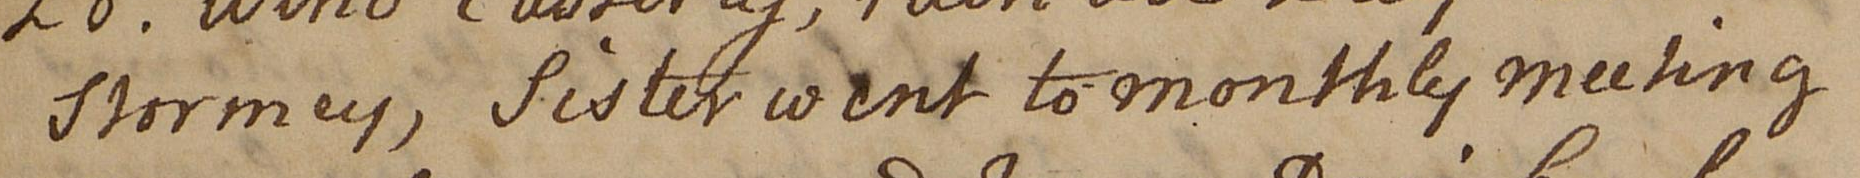Stormey, Sister went to monthly meeting
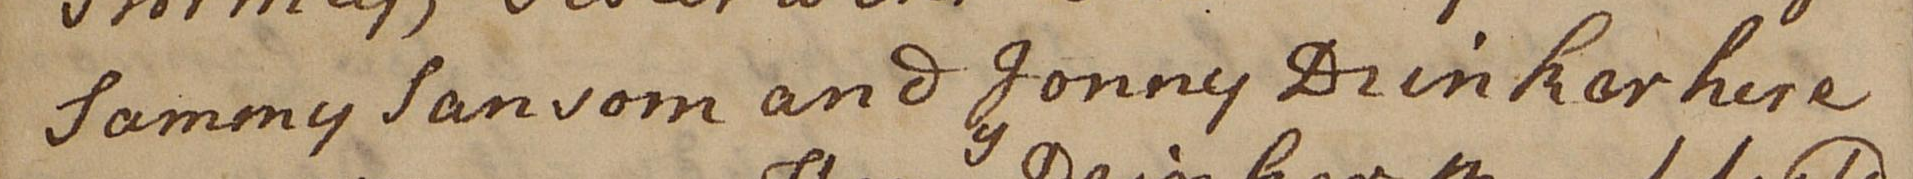Sammy Sansom and Jonny Drinker here
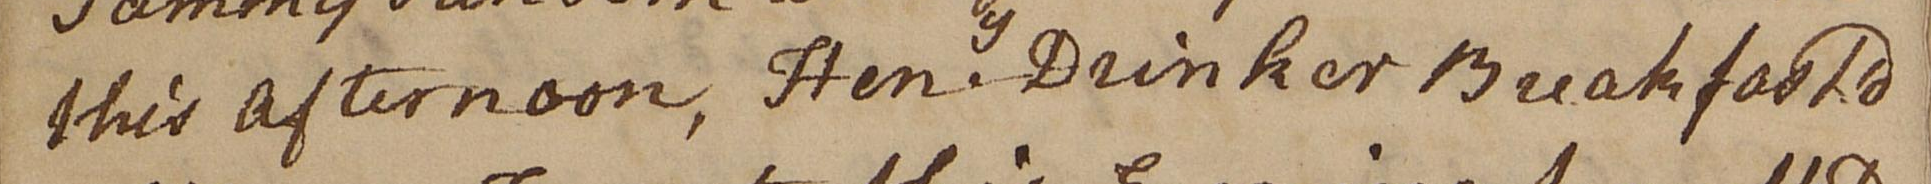this Afternoon, Hen^y. Drinker Breakfast'd
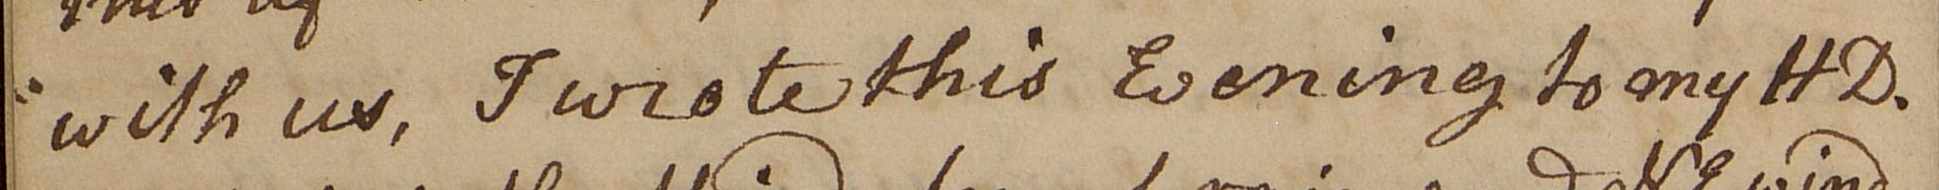with us, I wrote this Evening to my HD.
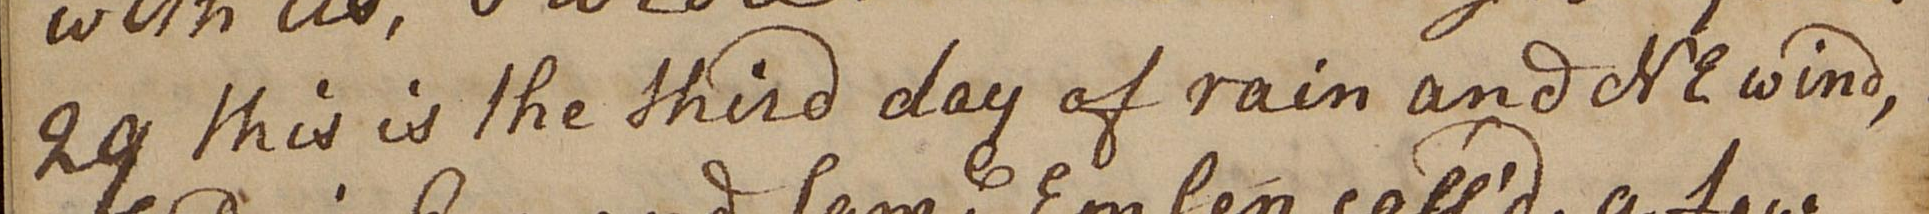29 this is the third day of rain and NE wind,
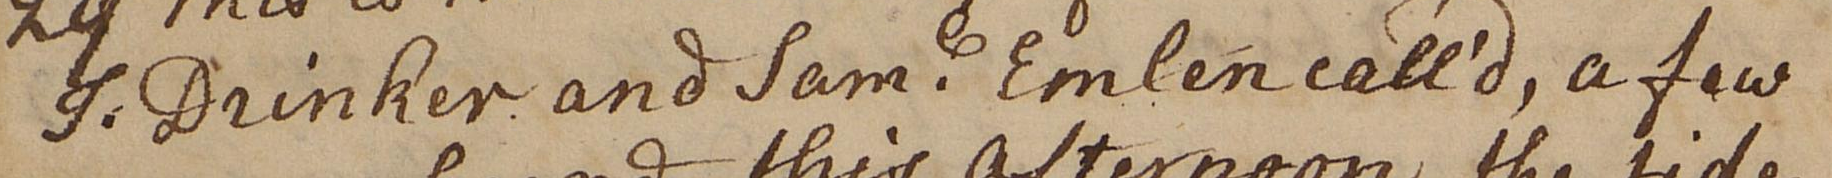T. Drinker and Sam^l. Emnlen call'd, a few
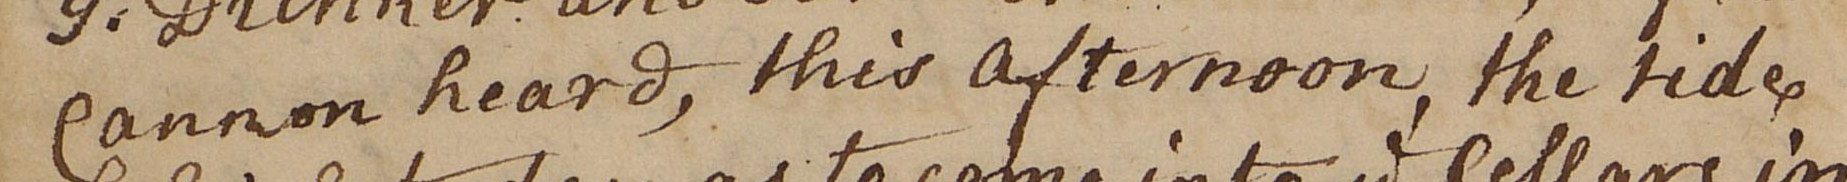cannon heard, this afternoon, the tide
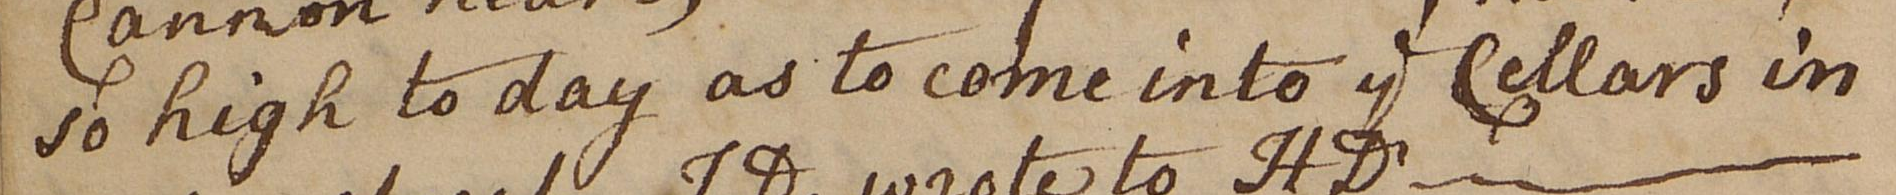so high to day as to come into y^e Cellars in
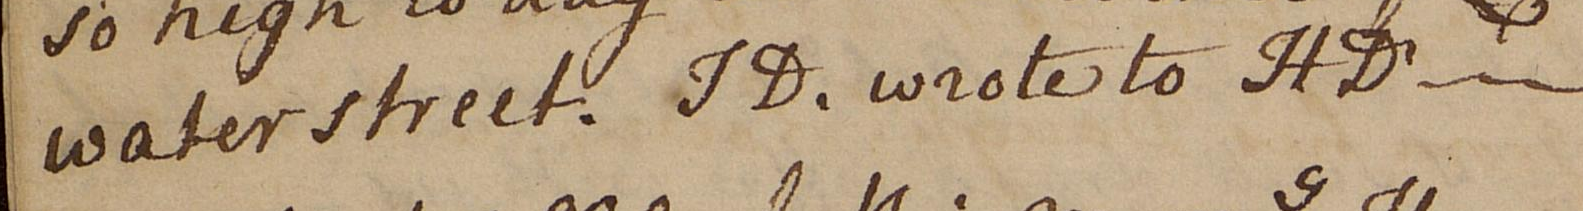water street. SD. wrote to HD-
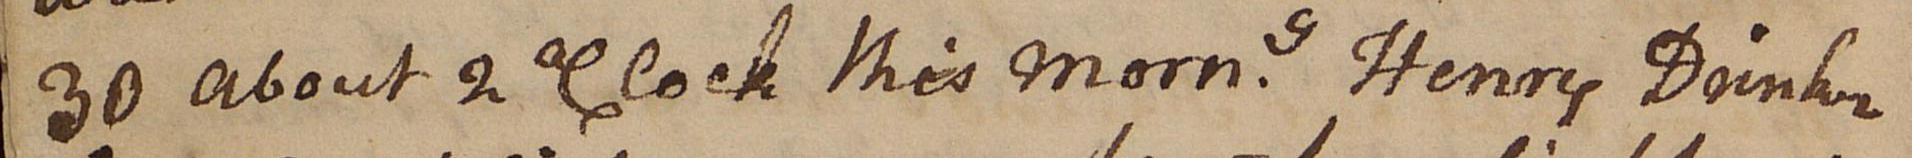30 about 2 oClock this morn^g. Henry Drinker
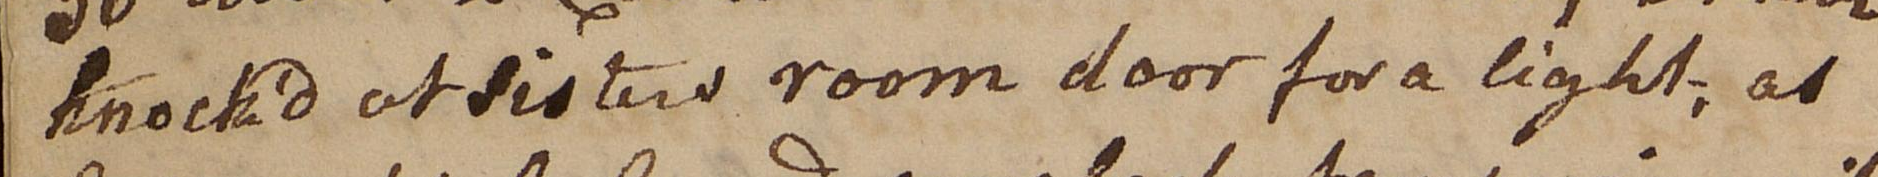knock'd at Sisters room door for a light: as
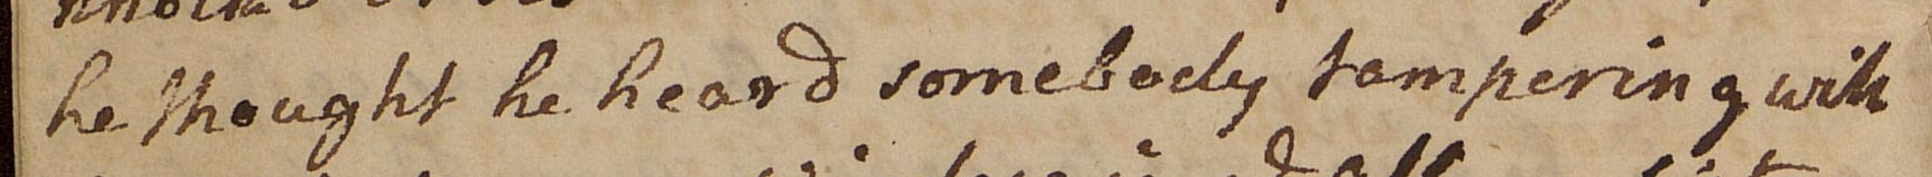he thought he heard somebody tampering with
